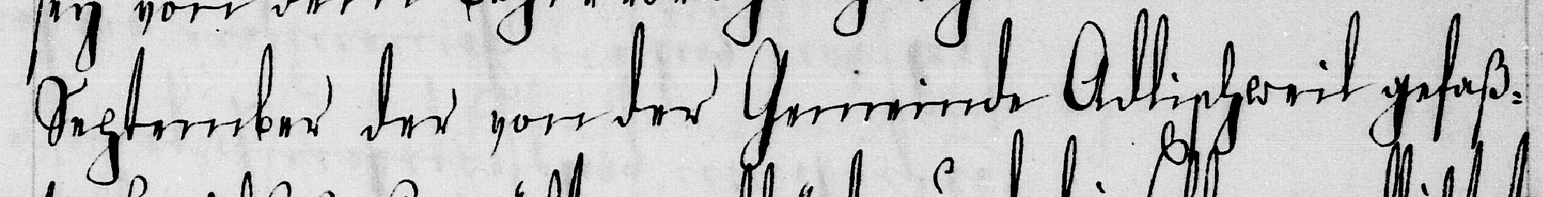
September der von der Gemeinde Adlischweil gefaß¬
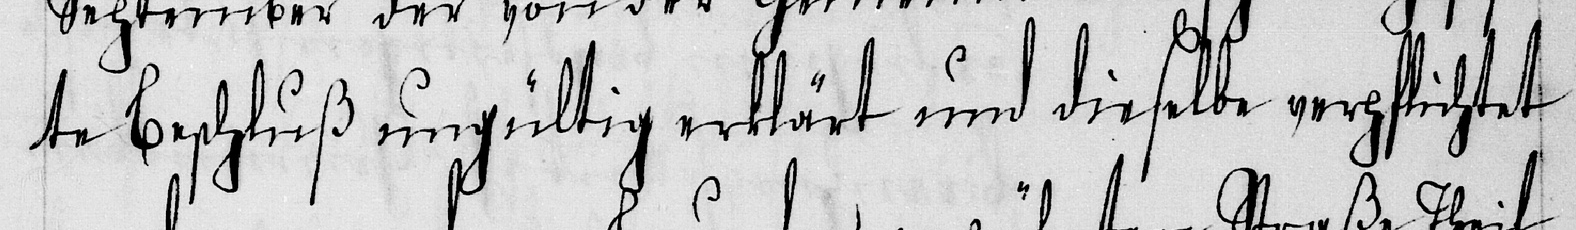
te Beschluß ungültig erklärt und dieselbe verpflichtet
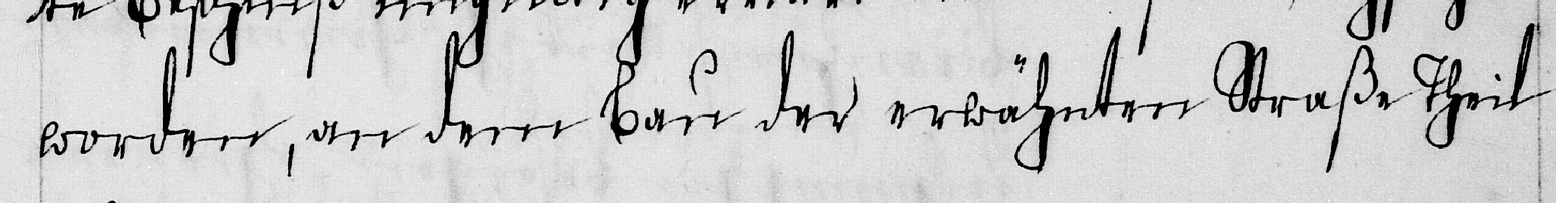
worden, an dem Bau der erwähnten Straße Theil
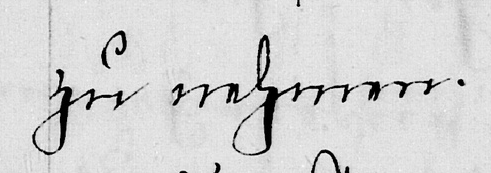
zu nehmen.
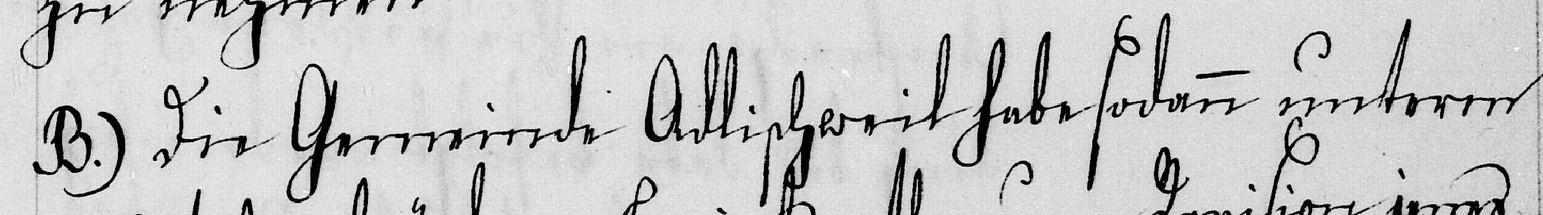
B.) Die Gemeinde Adlischweil habe sodann unterm
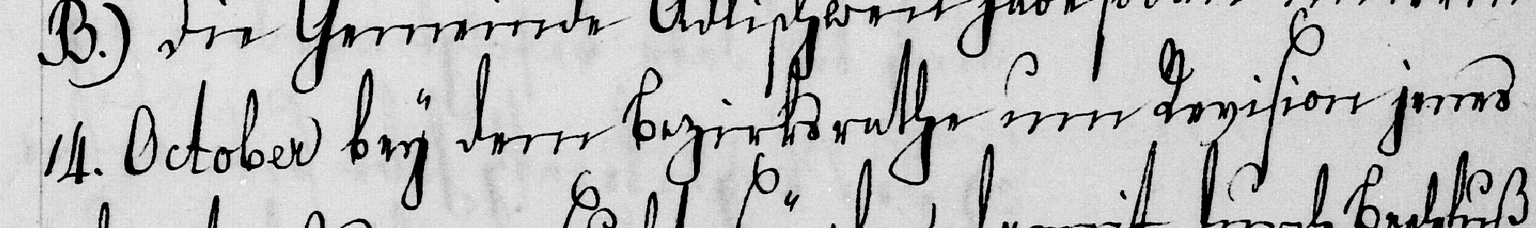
14. October bey dem Bezirksrathe um Revision jenes
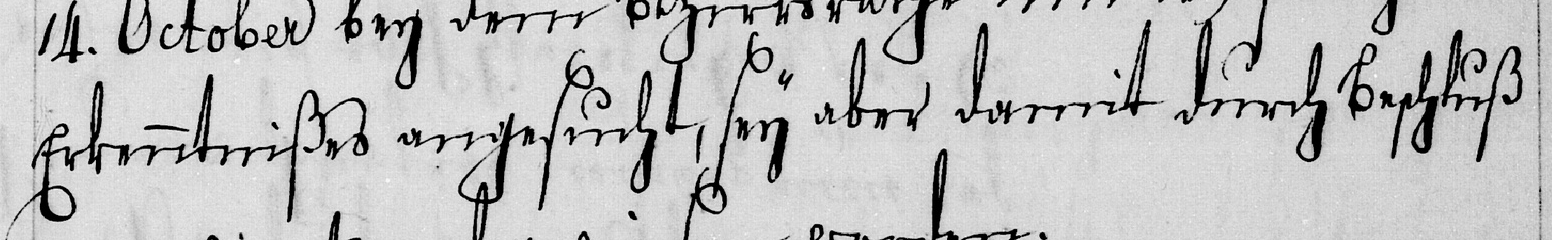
Erkenntnißes angesucht, sey aber damit durch Beschluß
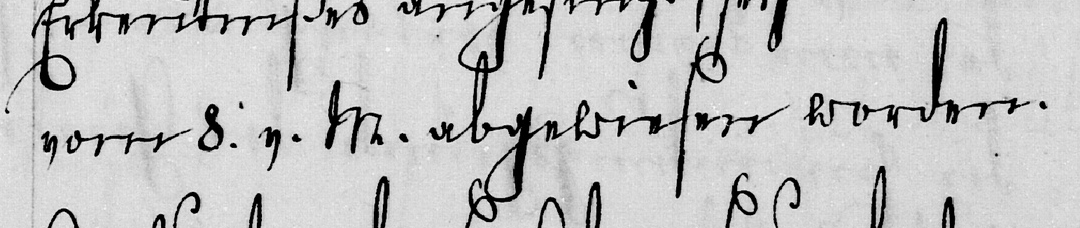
vom 8. v. M. abgewiesen worden.
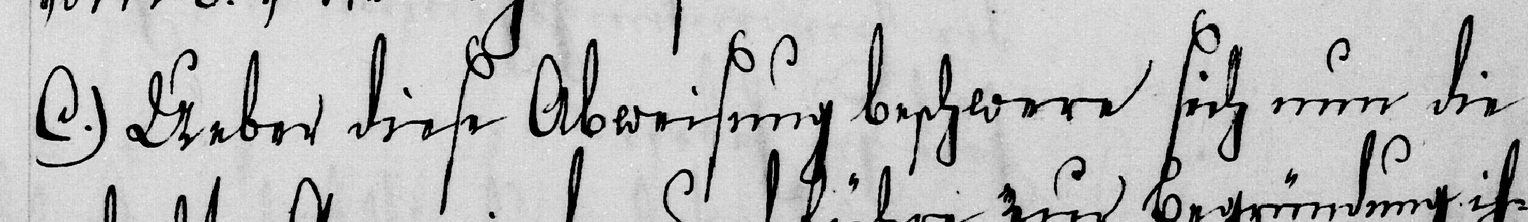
C.) Ueber diese Abweisung beschwere sich nun die
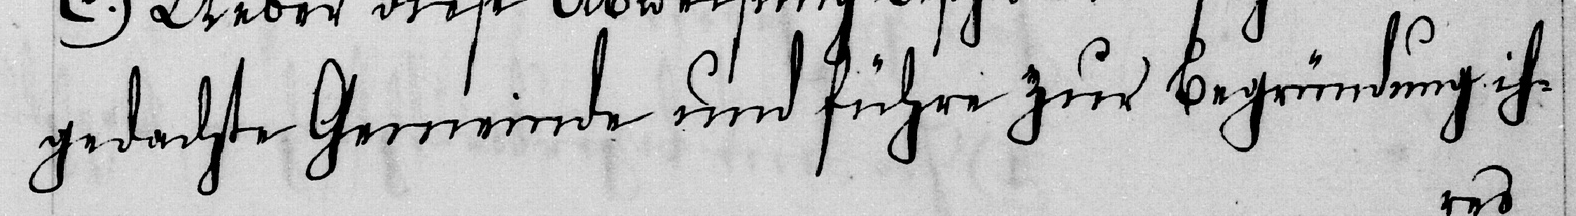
gedachte Gemeinde und führe zur Begründung ih
